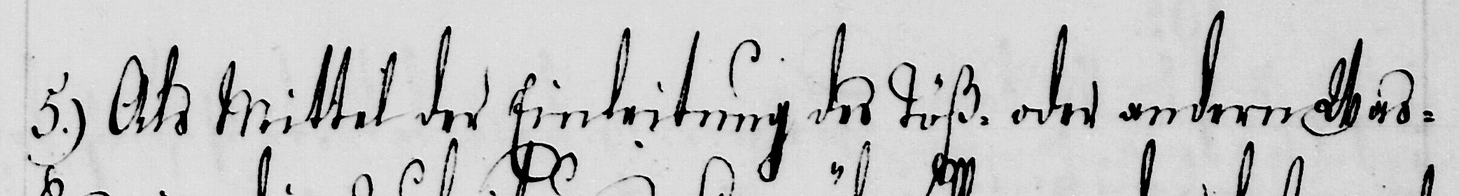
5.) Als Mittel der Einleitung des Töß- oder andern Wa¬
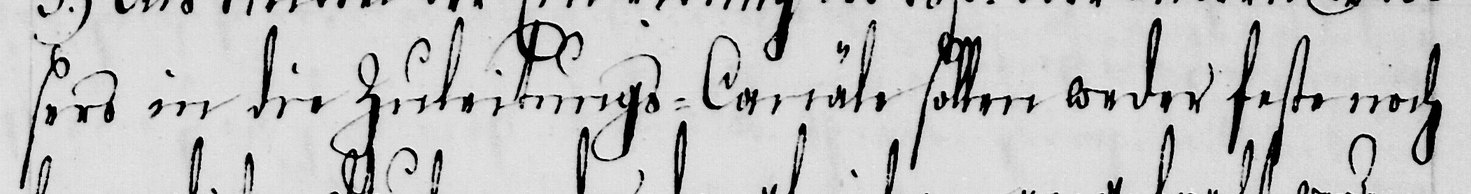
ßers in die Zuleitungs-Canäle sollen weder feste noch
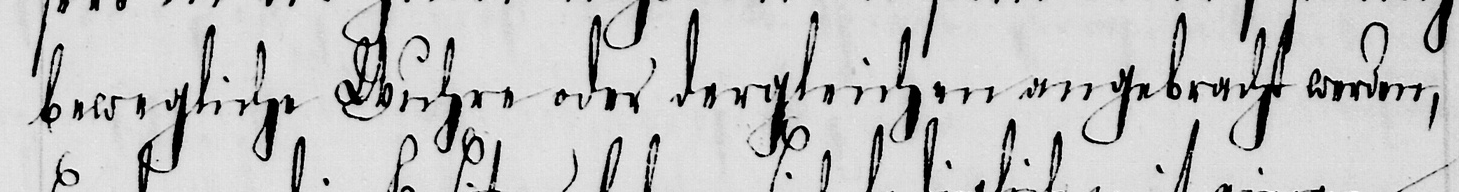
bewegliche Wuhre oder dergleichen angebracht werden,
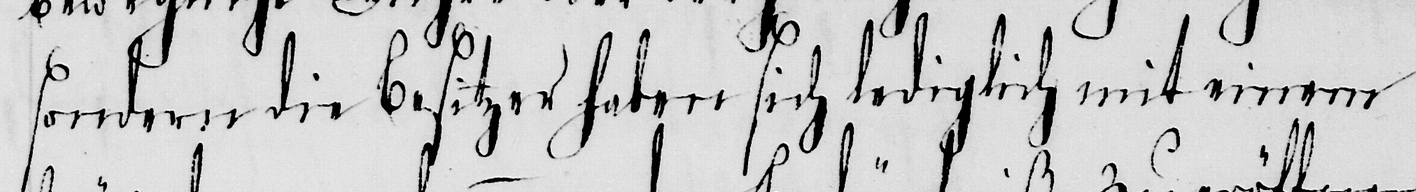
sondern die Besitzer haben sich lediglich mit einem
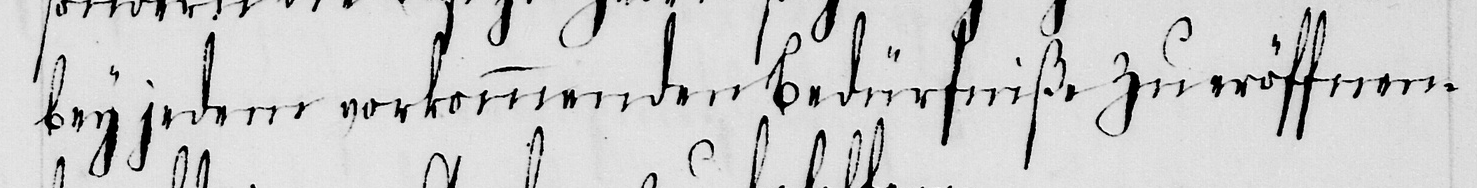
bey jedem vorkommenden Bedürfniße zu eröffnen¬
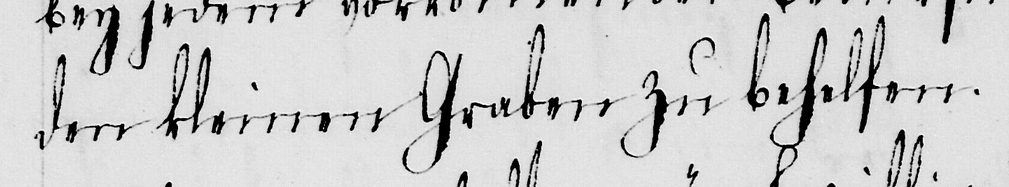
den kleinen Graben zu behelfen.
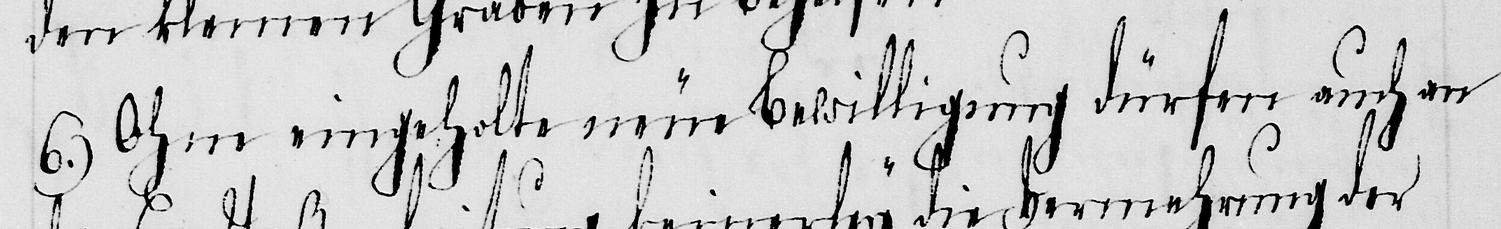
6.) Ohne eingeholte neue Bewilligung dürfen auch an
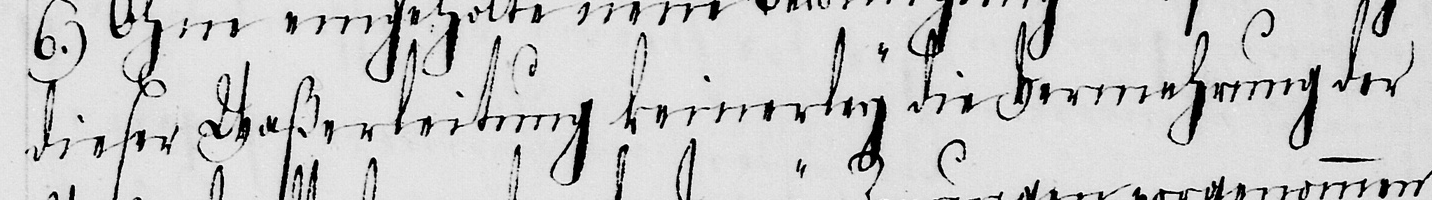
dieser Waßerleitung keinerley die Vermehrung der
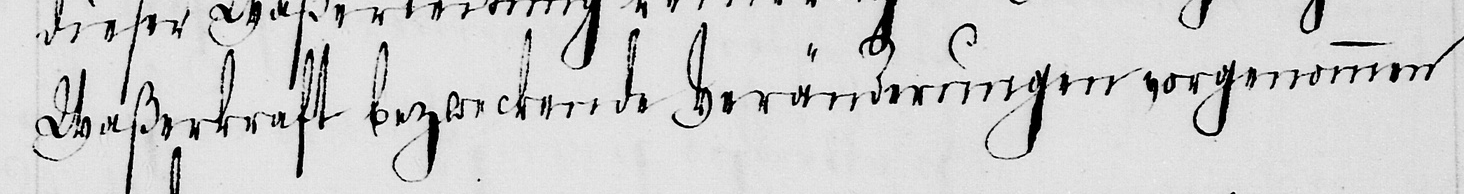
Waßerkraft bezweckende Veränderungen vorgenommen
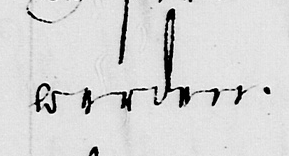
werden.
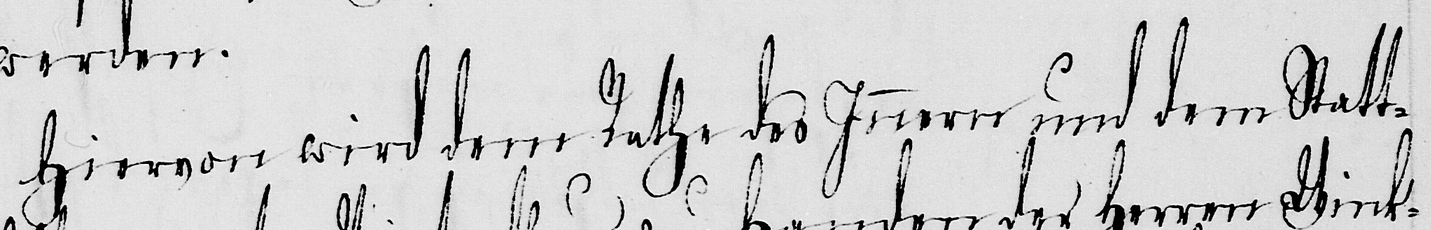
Hiervon wird dem Rathe des Innern und dem Statt¬
